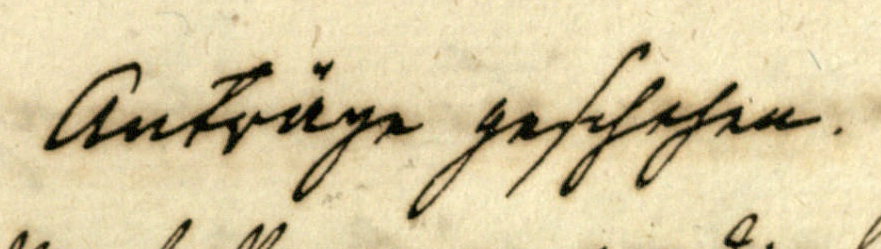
Anträge geschehen.
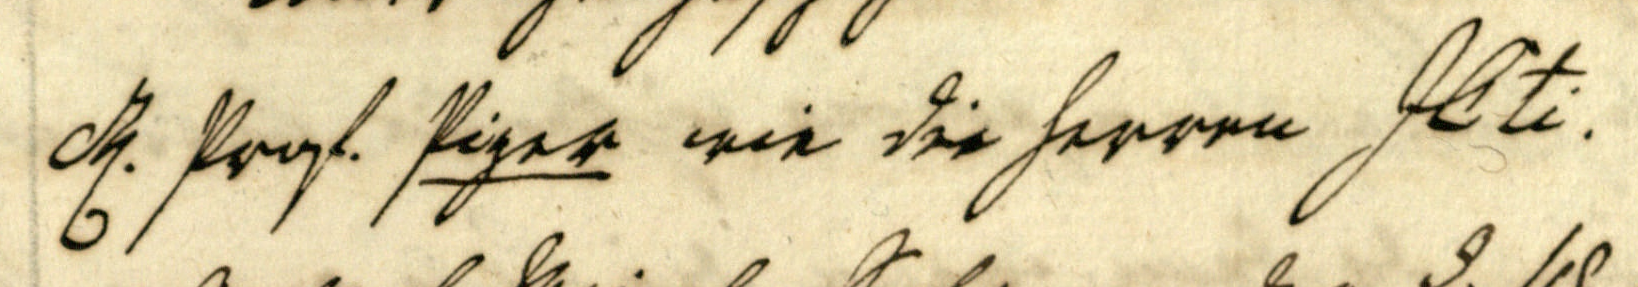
dh. Prof. Piper wie der Herren Jlti.
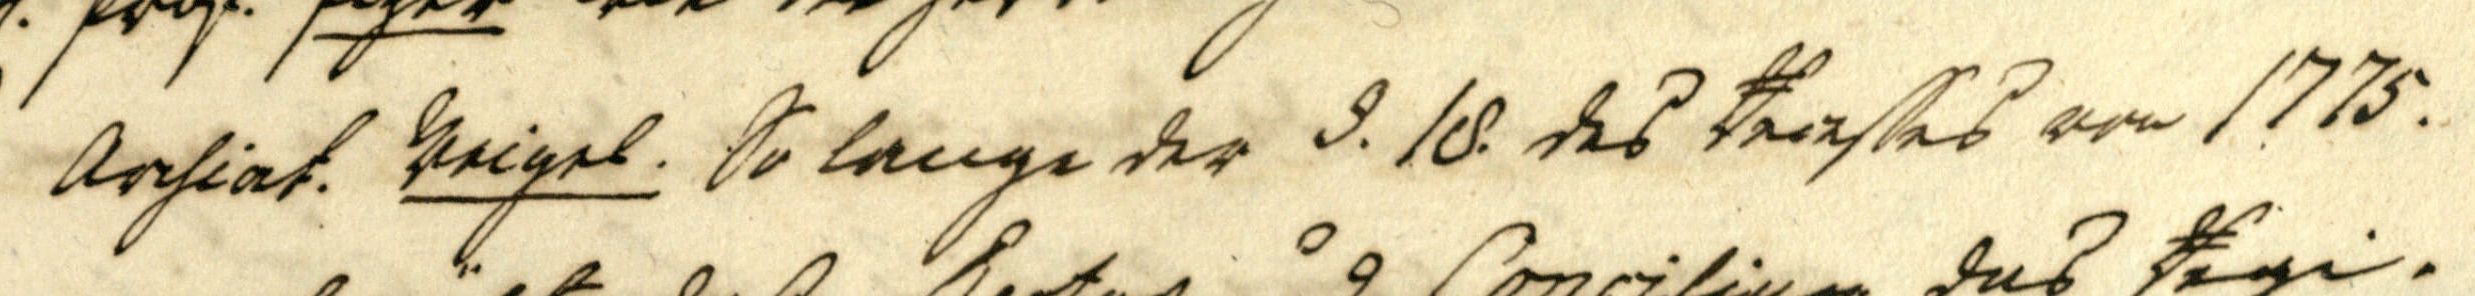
Archiat. Weigel. So lange der §. 18 des Recesses von 1775.
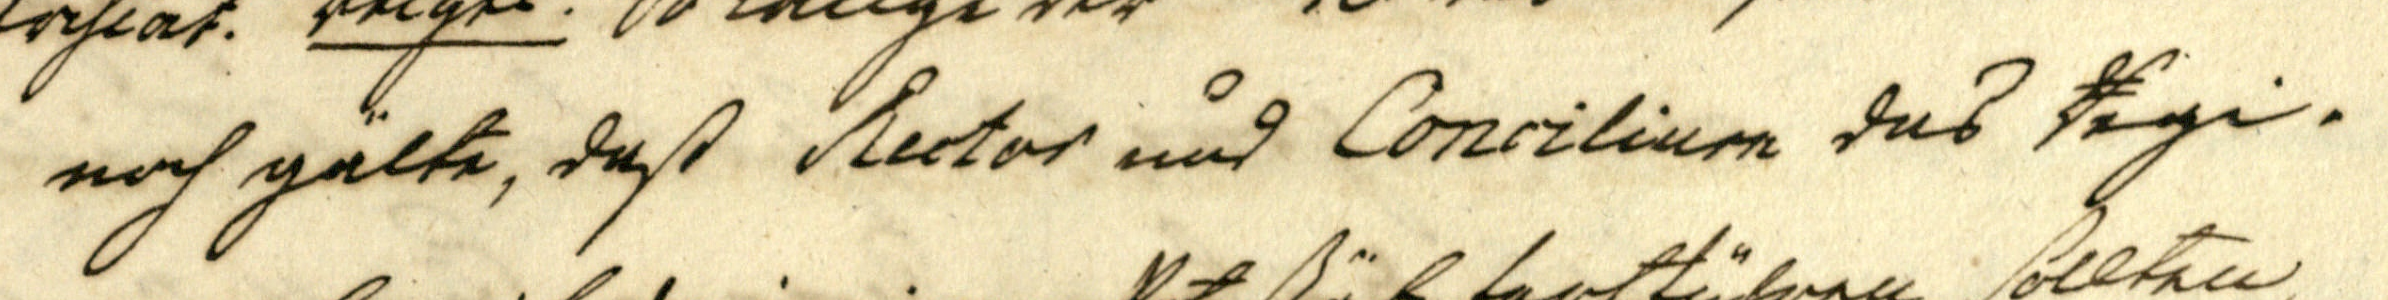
noch gälte, daß Rector und Concilium das Regi¬
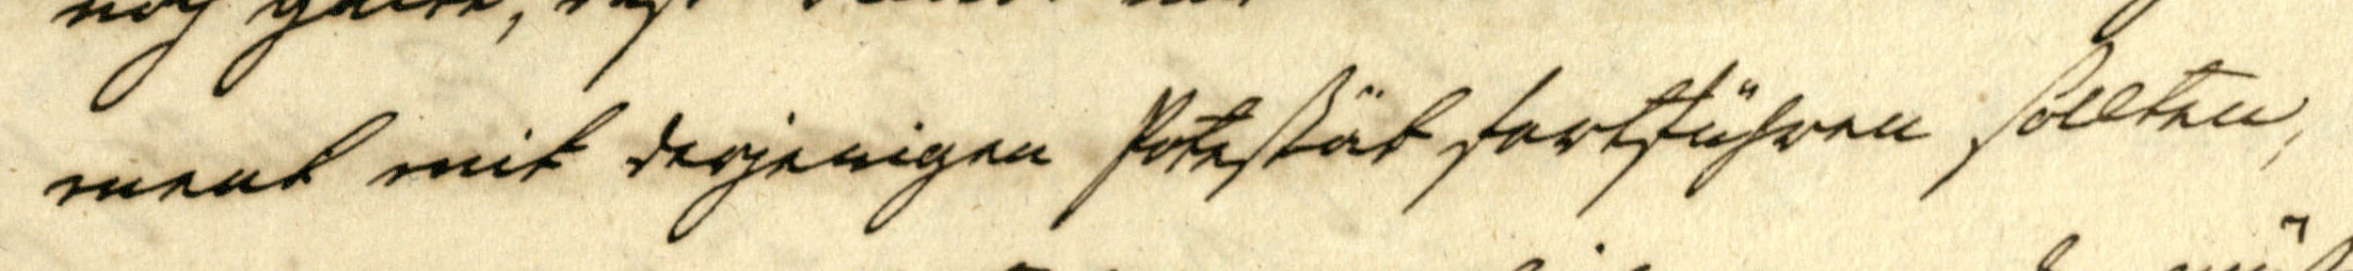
giment mit derjenigen Potestät fortführen sollten,
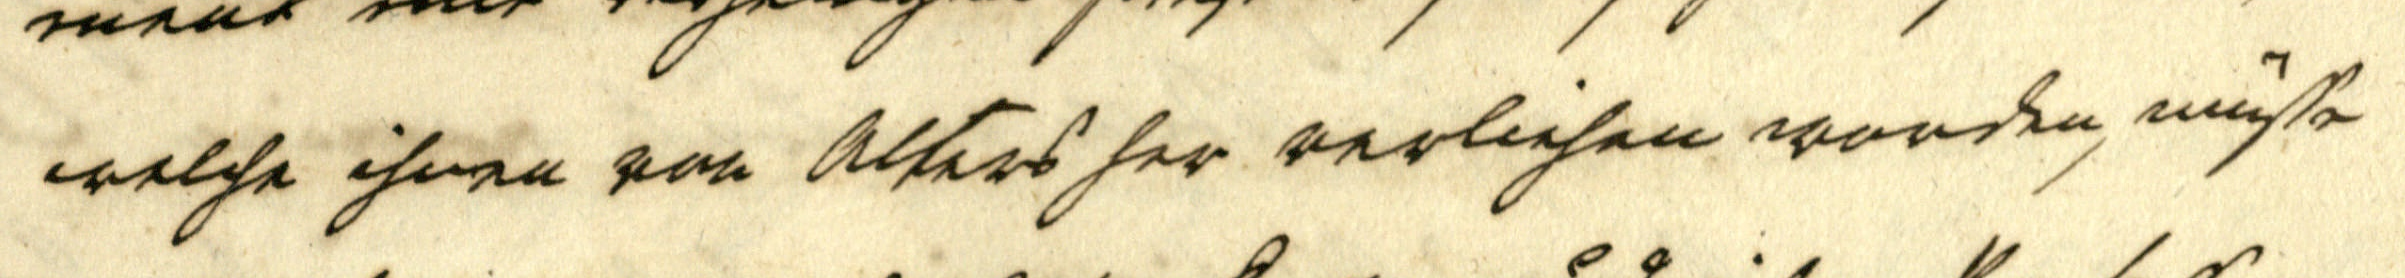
welche ihnen von Alters her verliehen worden, müsse
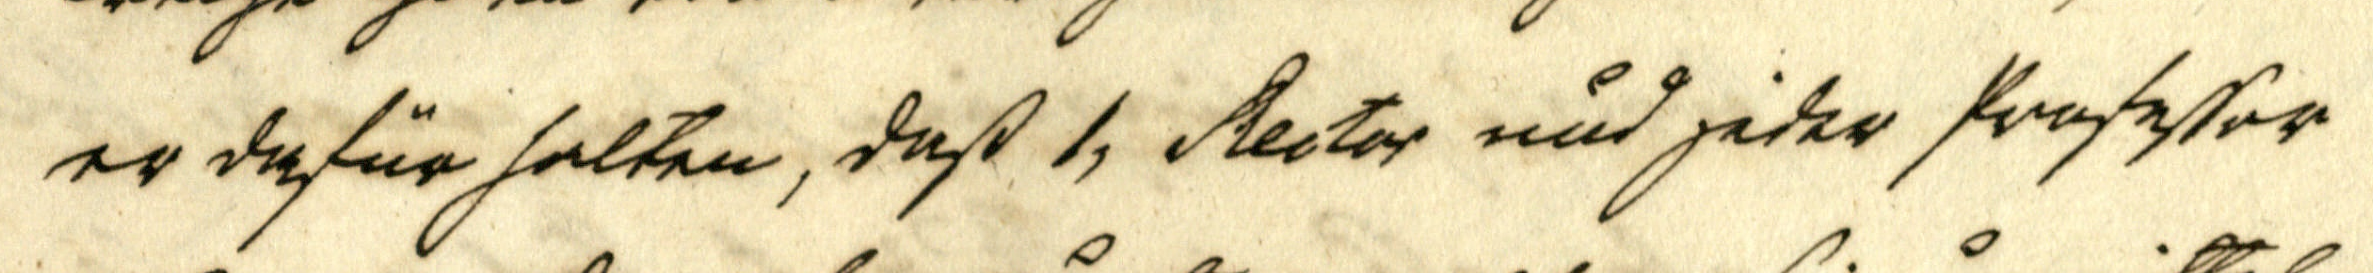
er dafür halten, daß 1, Rector und jeder Professor
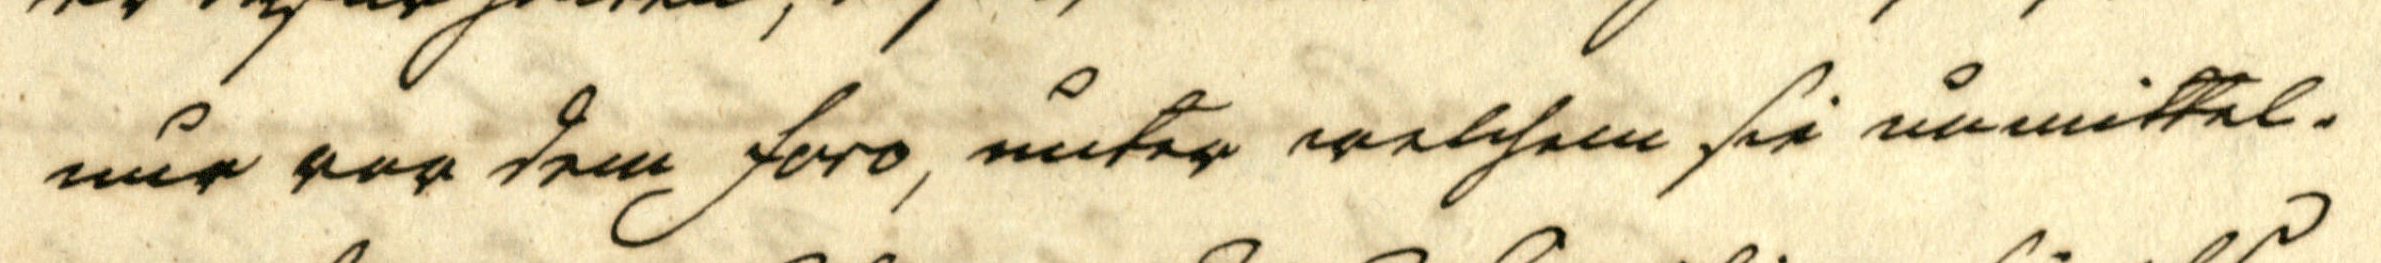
nur vor dem foro unter welchem sie unmittel¬
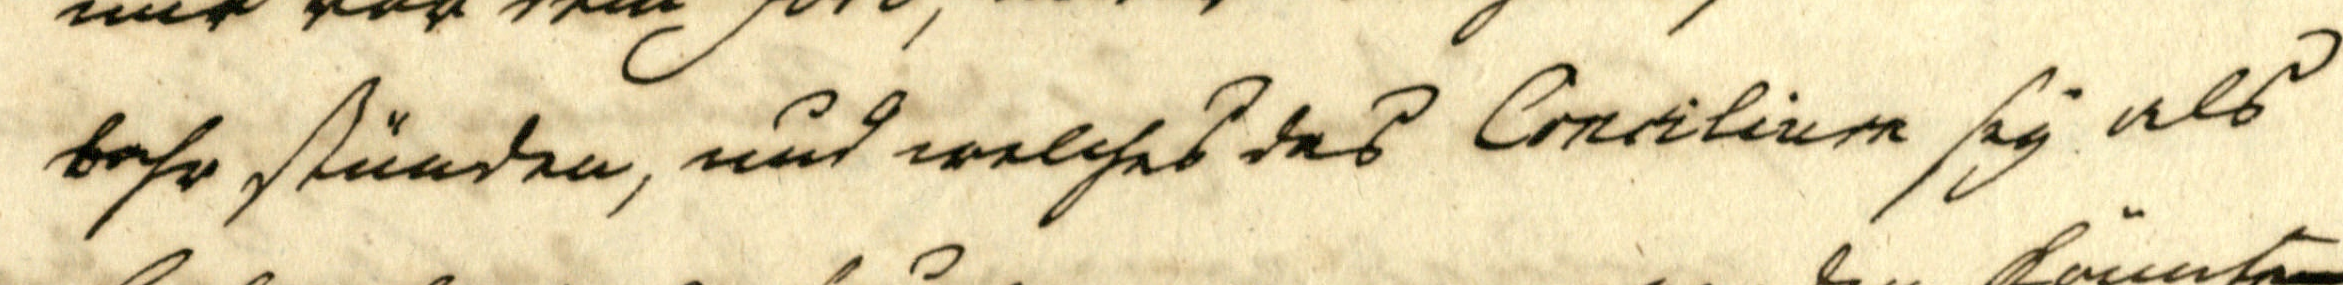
bahr stünden, und welches das Concilium seÿ als
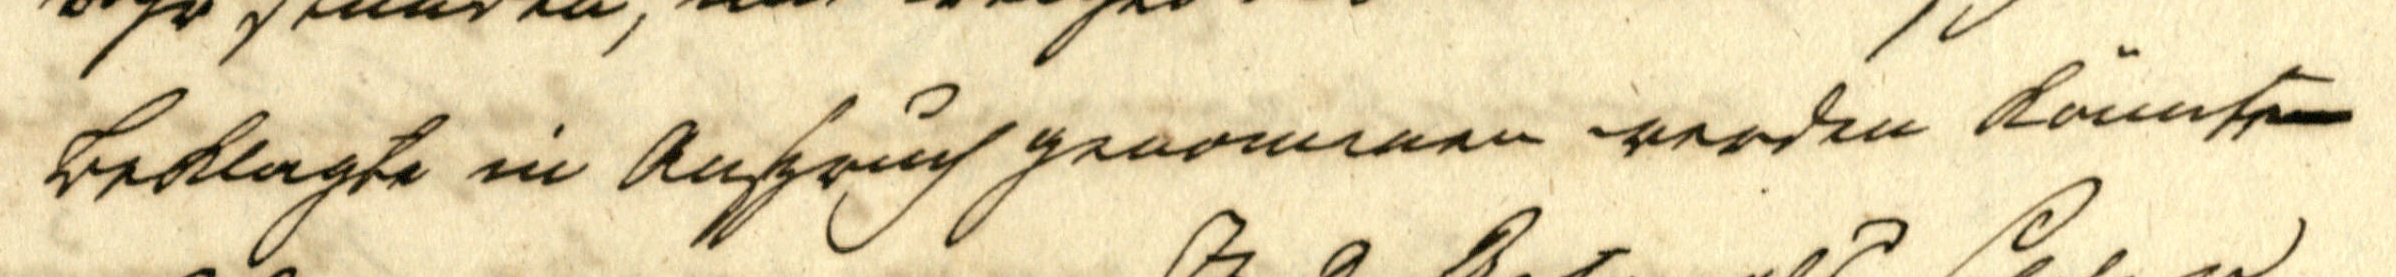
Beklagte in Anspruch genommen werden könnten
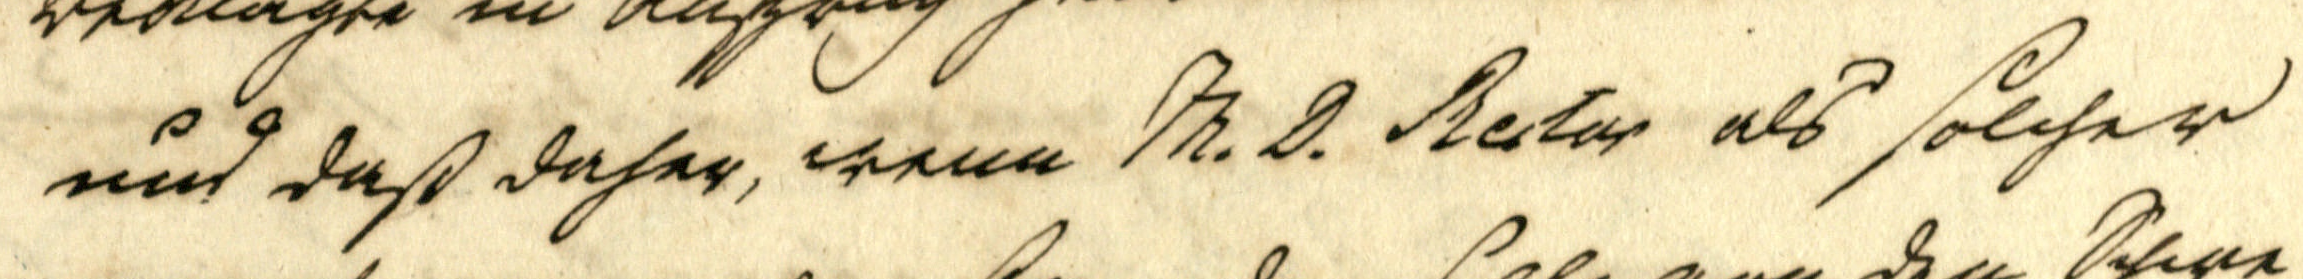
und daß daher, wenn M. D. Rector als solcher
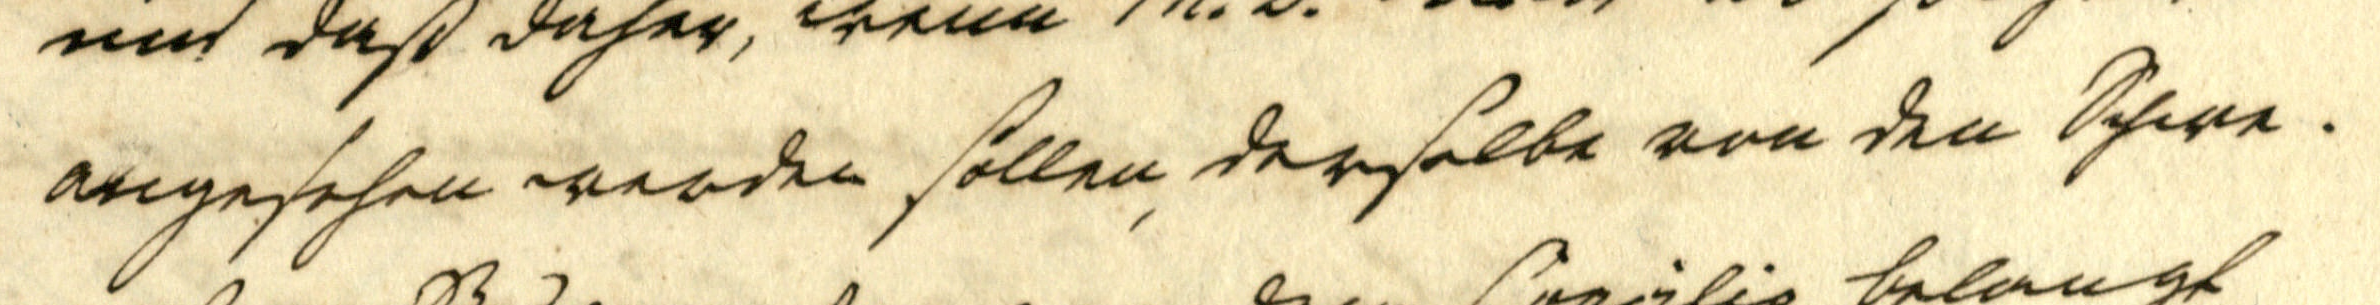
angesehen werden sollen, derselbe von den Schwe¬
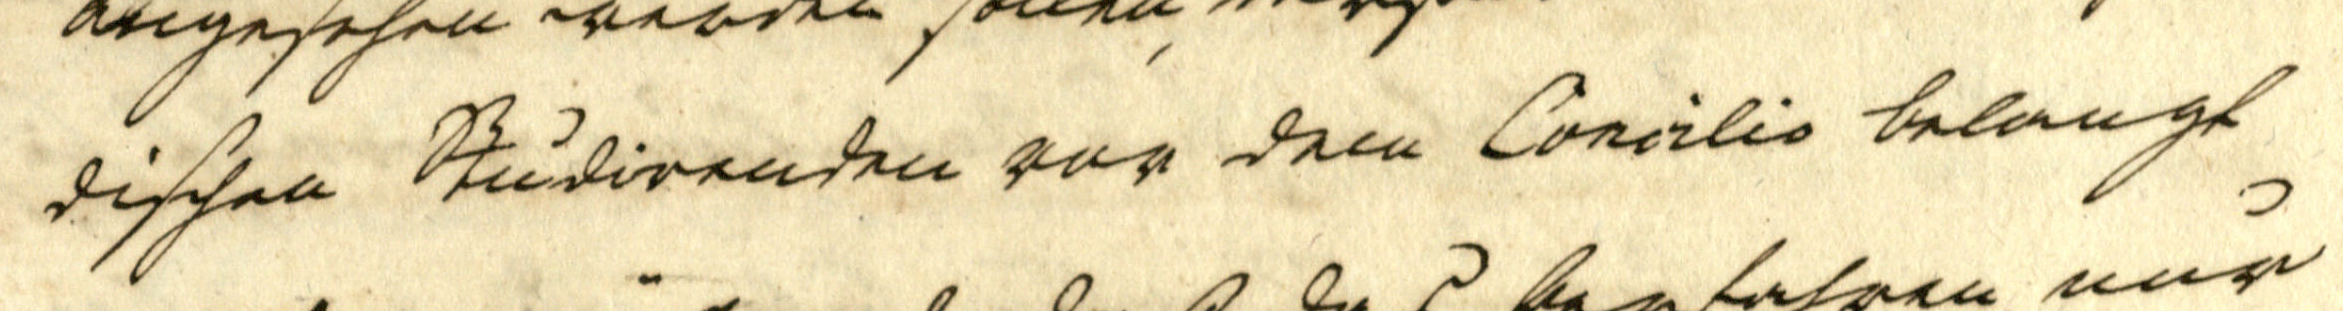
dischen Studirenden vor dem Concilio belangt
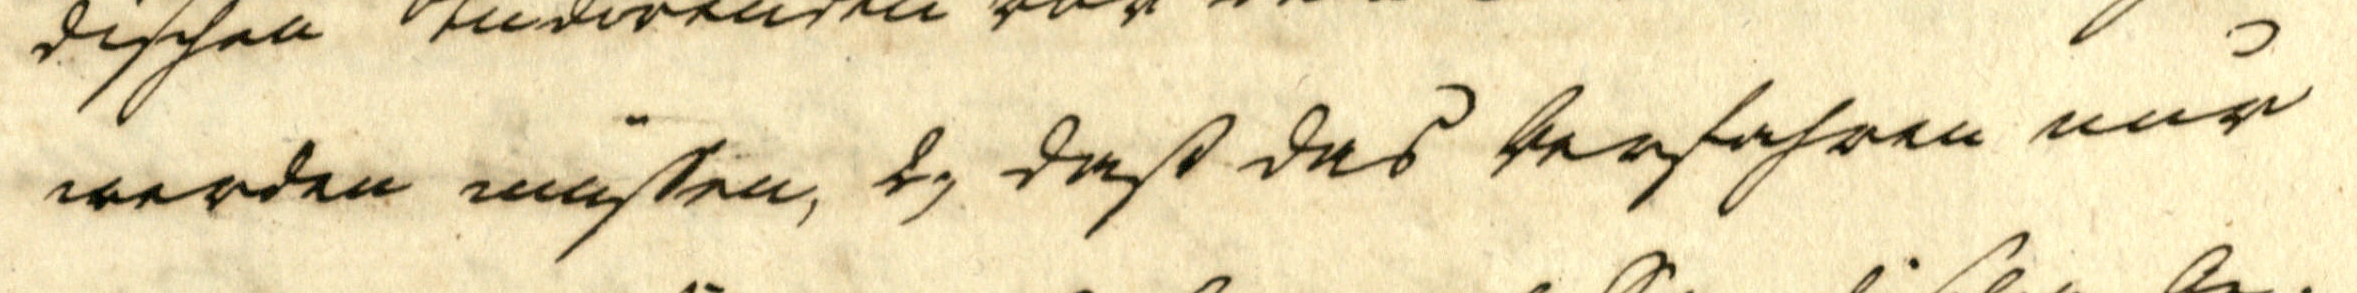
werden müssen, 2, daß das Verfahren nur
